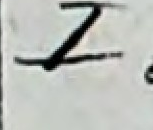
I
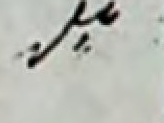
do
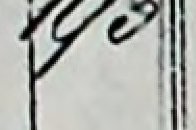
193
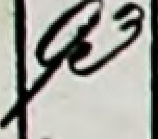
93
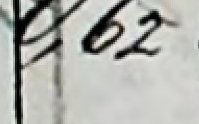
0,62
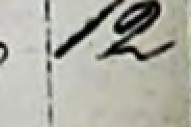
12
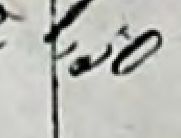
1,50
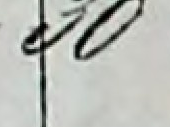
30
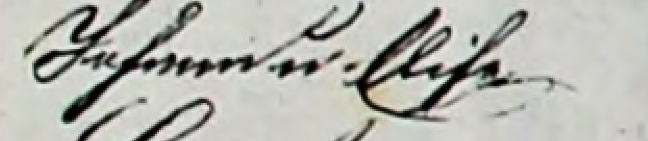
Johann u. Elise
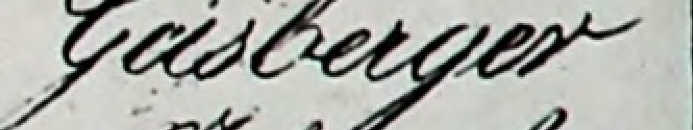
Gaisberger
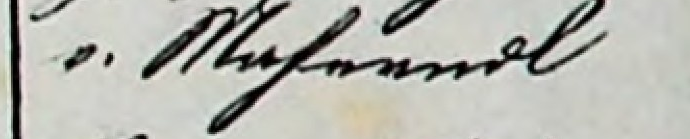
v. Maherndl
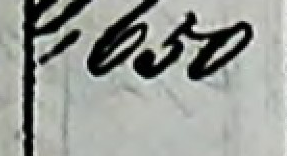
0,650
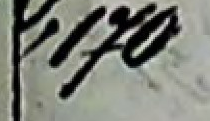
0,170
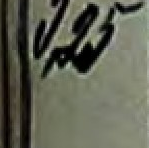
3,25
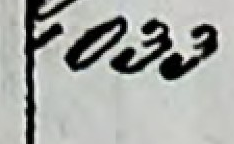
0,033
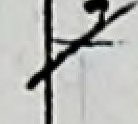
7
